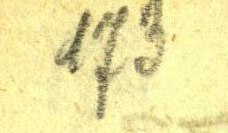173
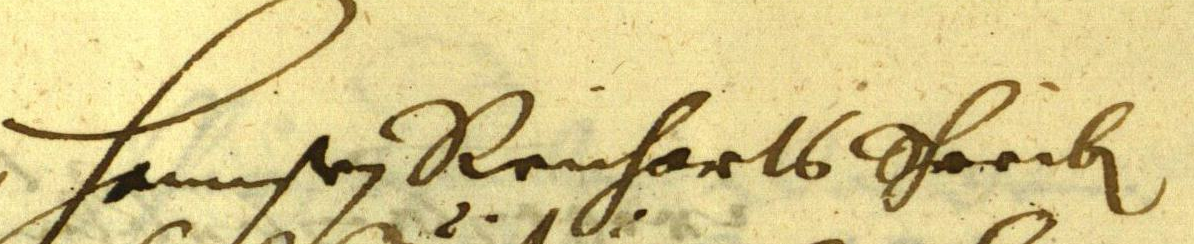hannsen Reichardts Schreib
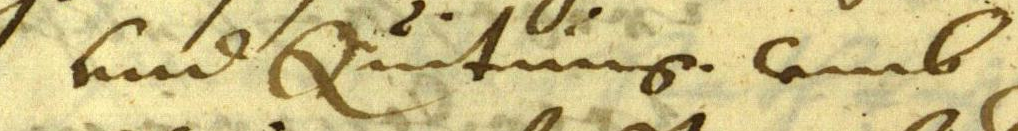vnd Qūitūng. vmb
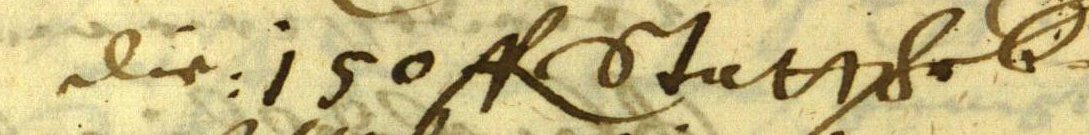die: 150 fl Stattschr¬
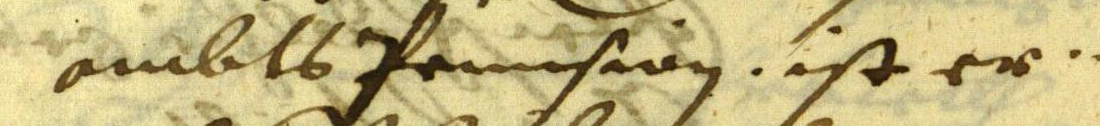ambts Pennsion. ist er¬
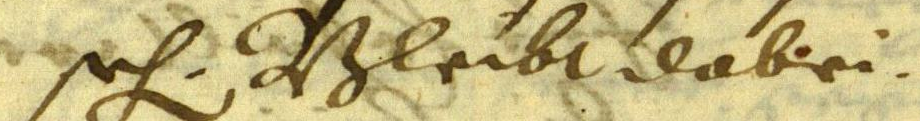seh. Bleibt dabei.
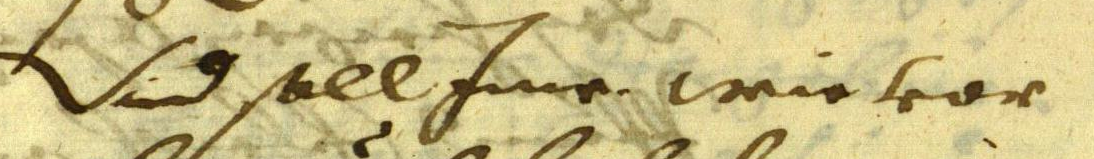Vnd soll Ime. wie vor
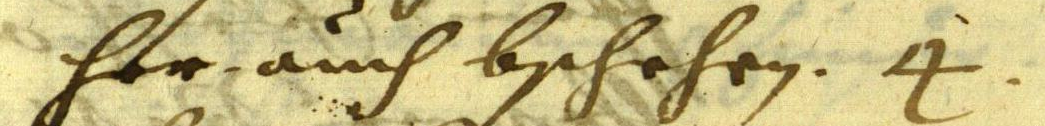her. aūch bschehen. 4.
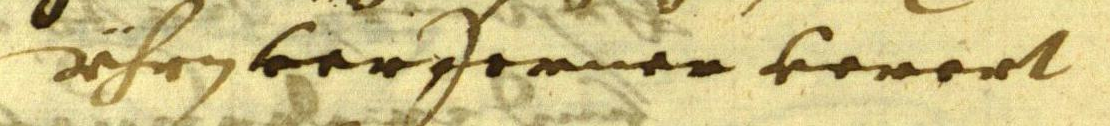v̈hrn ver Jerner verert
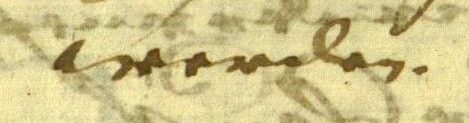werden.
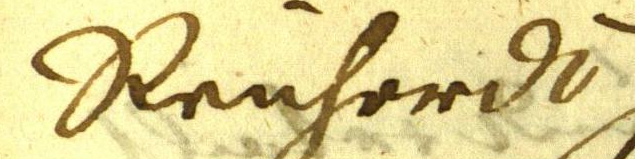Reichardt
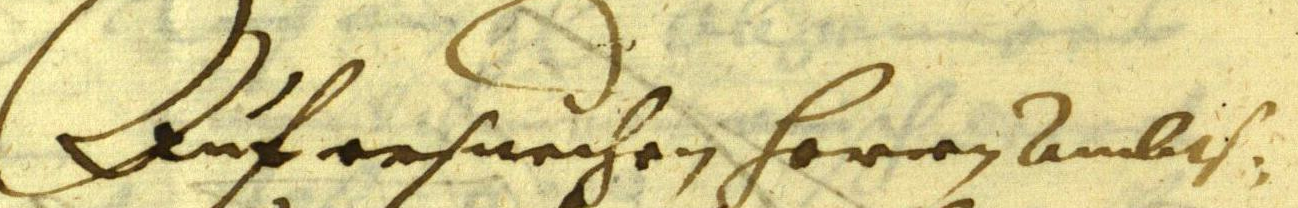Aūf ersūechen herrn Ambts¬
